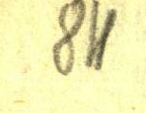84
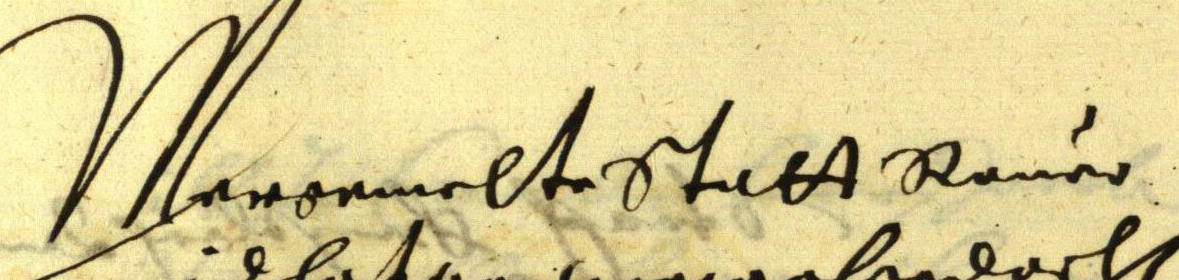Mergemelte Statt Roūer¬
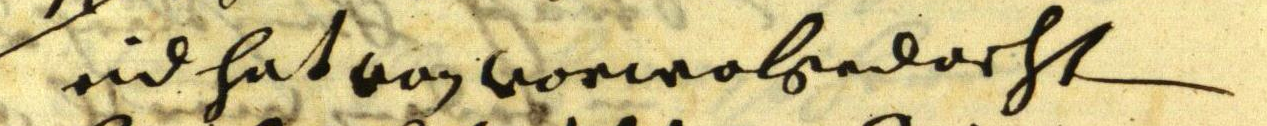eid hat von vorwolgedacht
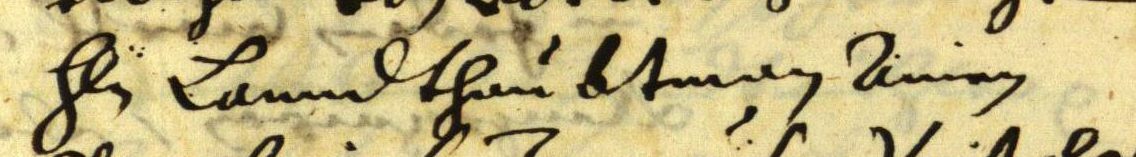hln Lanndthaūbtman Ainen
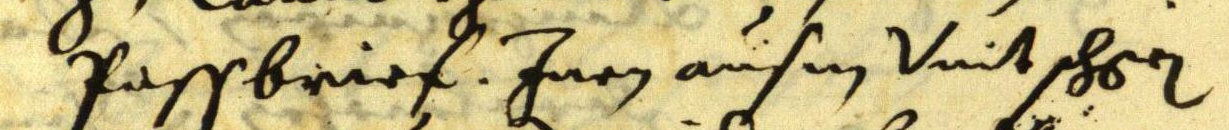Passbrief. Inen aūfm Vintschgej
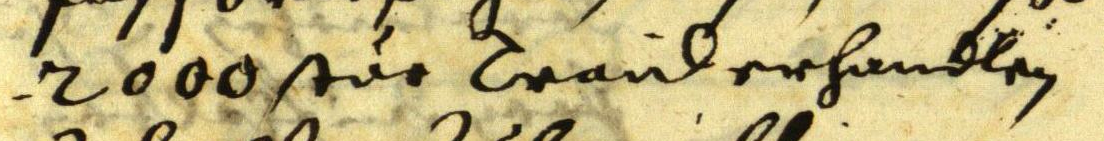.2000 stār Traid erhandlen
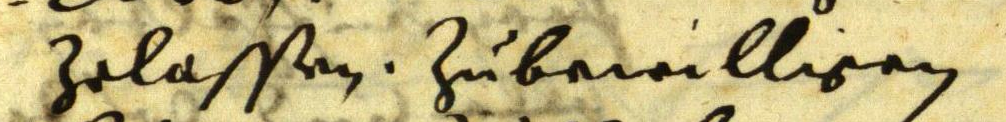Zelassen. Zūbewilligen,
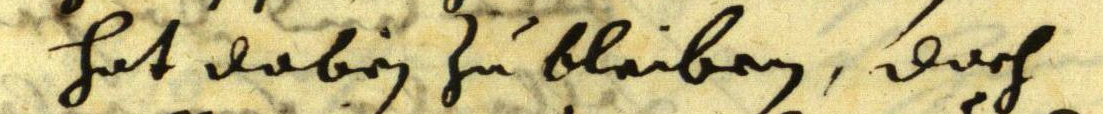hat dabej Zū bleiben, doch
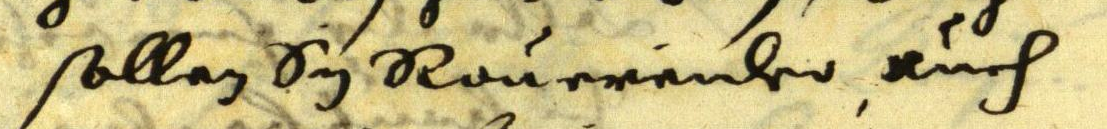sollen Sy Roūereider aūch
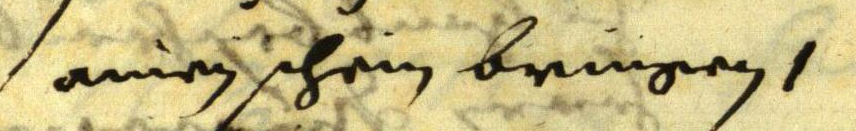ainen schein bringen,
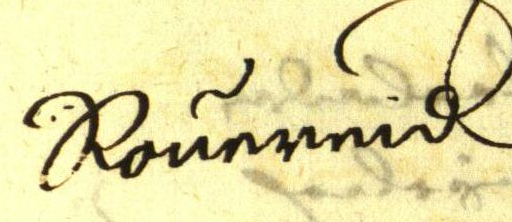Roūereid
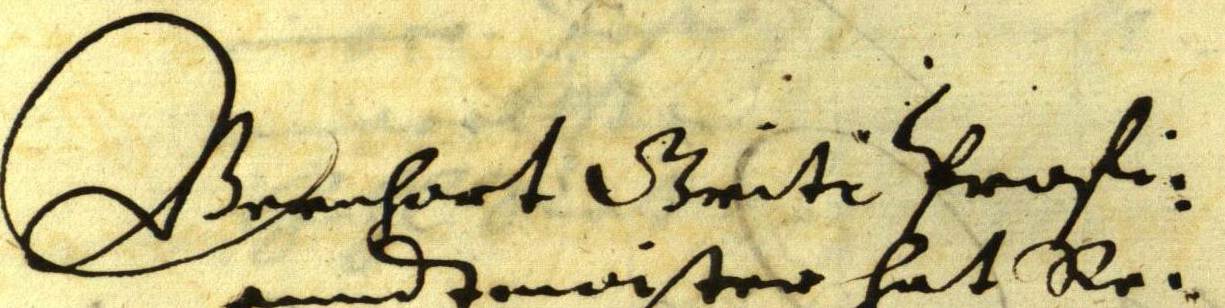Bernhart Griti Profi¬
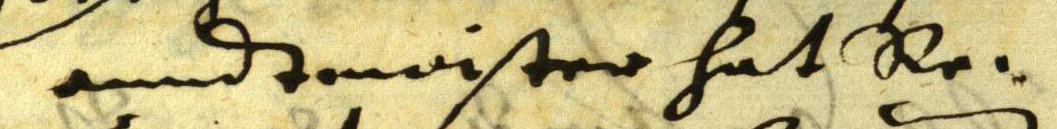anndtmaister hat Re¬
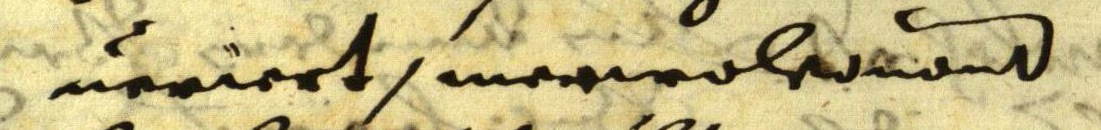ūeriert, merwolernant
